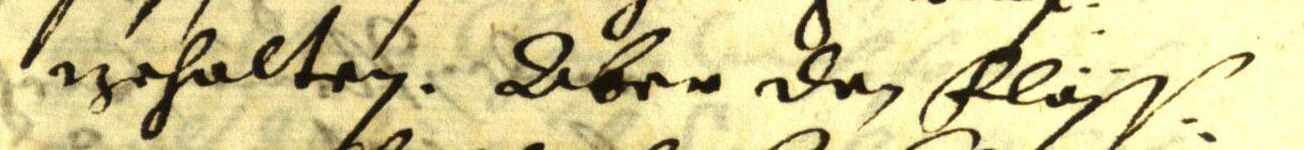zehalten. Aber den Flöss¬
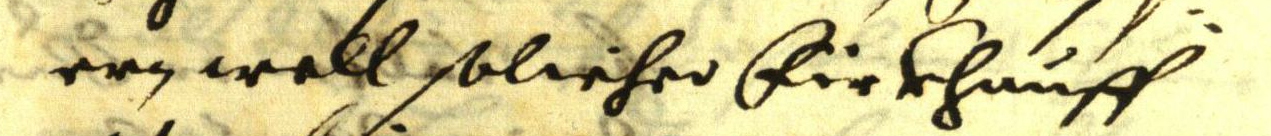ern well solicher Firkhaūff
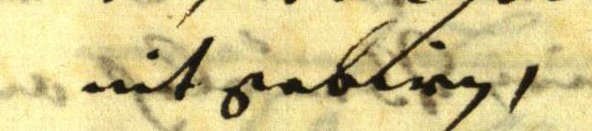nit gebirn,
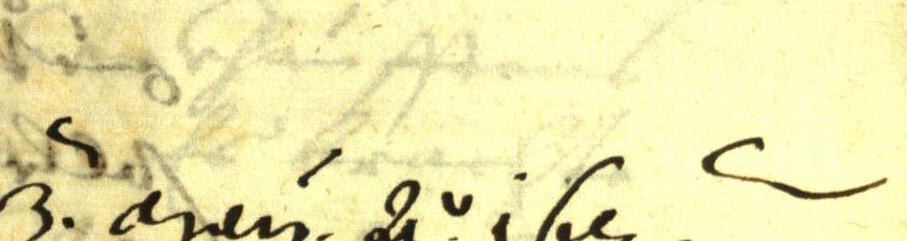t t
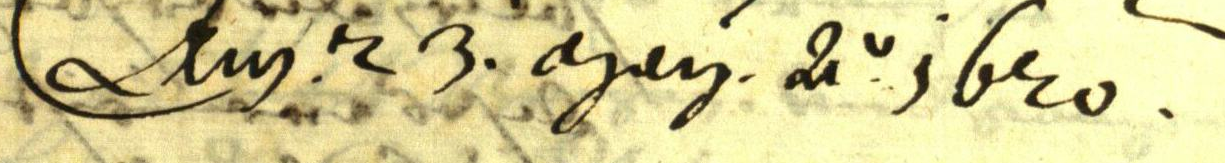Am .23. Maȳ. Ao. 1620.
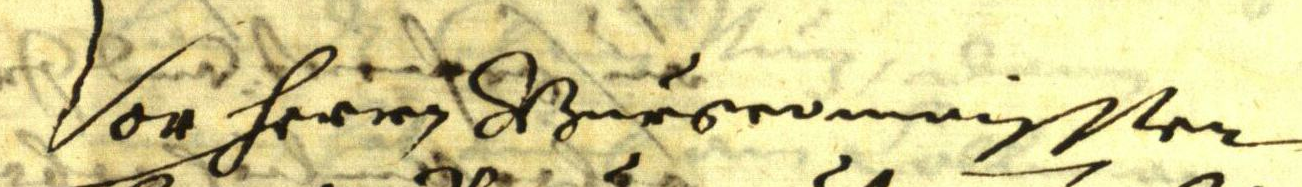Vor herrn Būrgermaisster
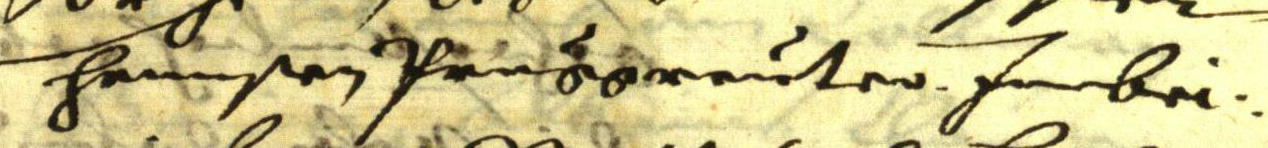hannsen Prūggreūter. Innbei¬
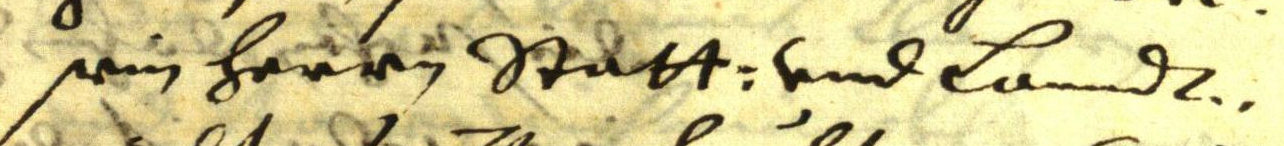sein herrn Statt: vnd Lanndt¬
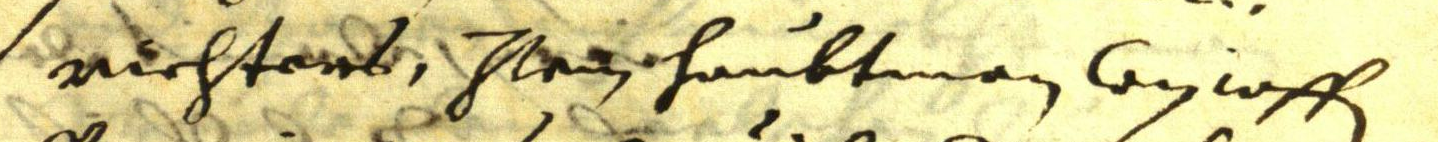richters, Item haūbtman Cristoff
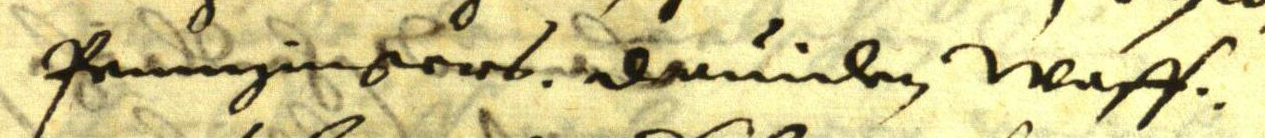Pennzingers. Daūiden Waff¬
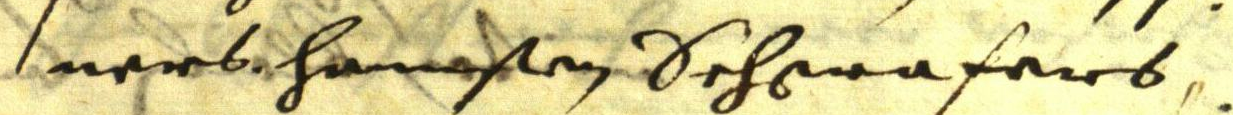ners. hannsen Schgrafers.
